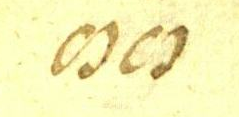88
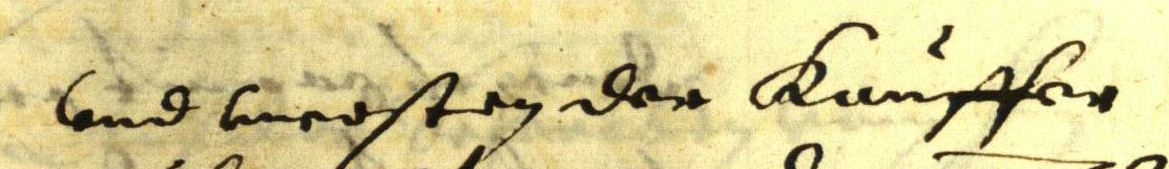vnd vncosten der Kaūffer
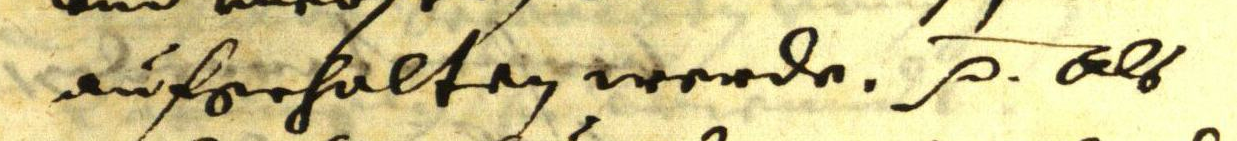aūfgehalten werde. etc. Als
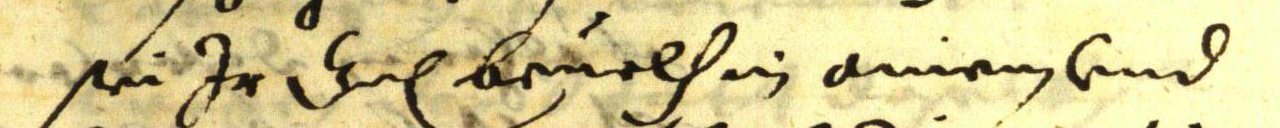sei Ir Gn beūelh in ainem vnd
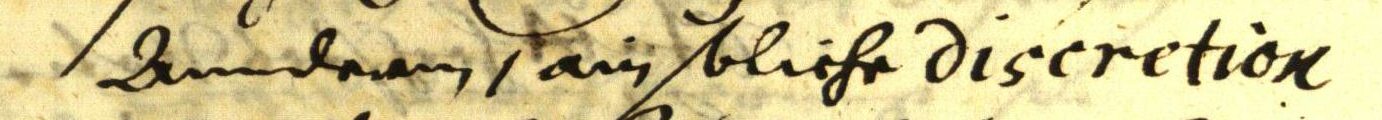Annderm, ain soliche discretion
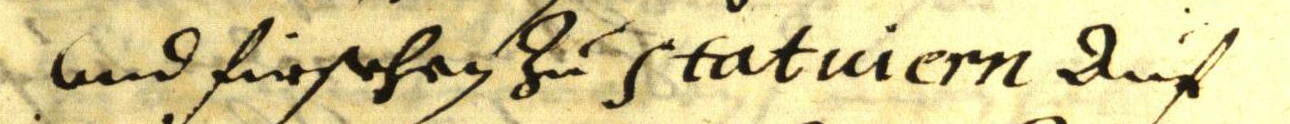vnd firsehen Zū statuiern Aūf
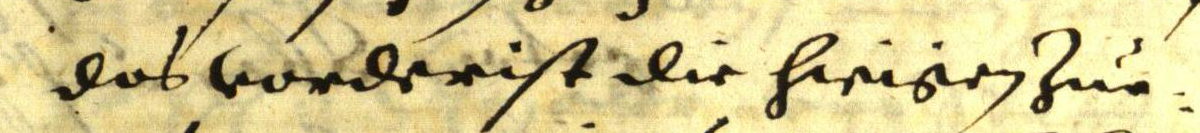das vorderist die hieigen Zūe¬
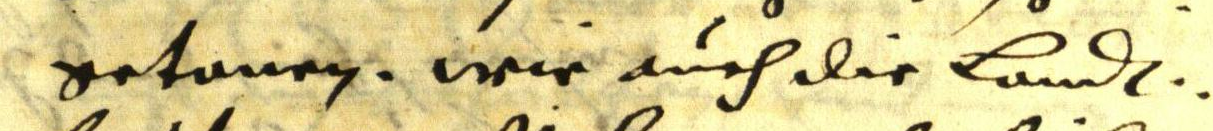getanen. wie aūch die Landt¬
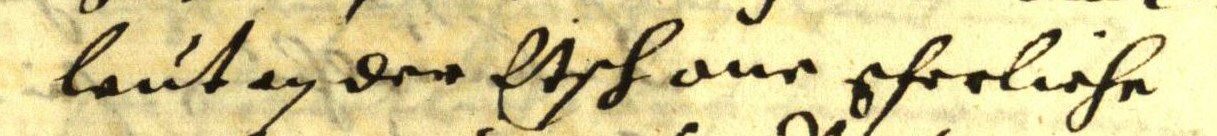leūten der Etsch one gferliche
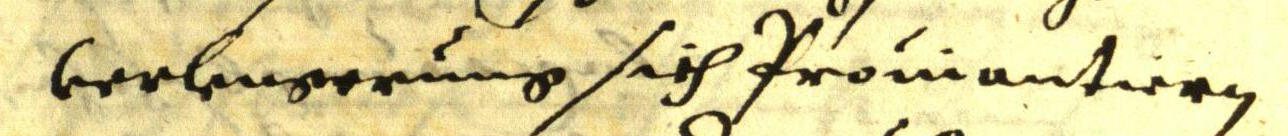verlengerūng sich Poviantiern
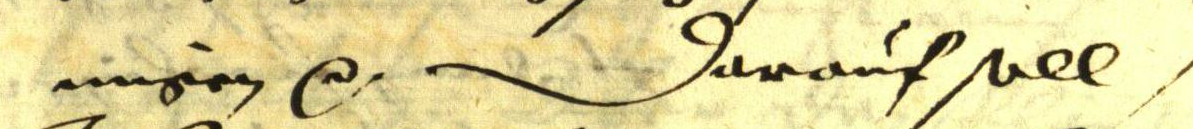migen etc. Daraūf soll
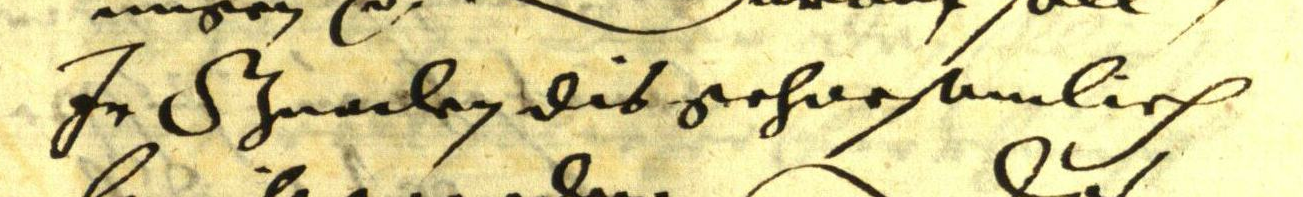Ir Gnaden dis gehorsamlich
